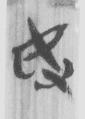奴
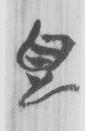見
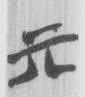亓
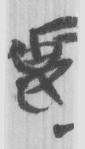妻
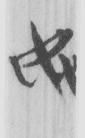奴
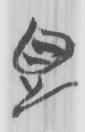見
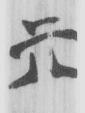而
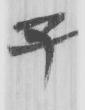子
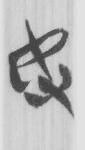奴
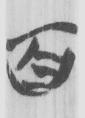百
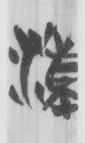湩
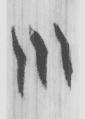川
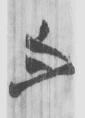之
